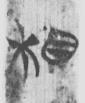相
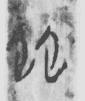{化化}
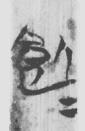飤=
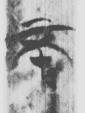不
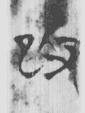攺
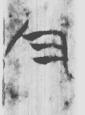今
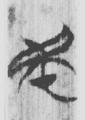民
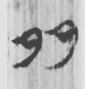多
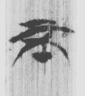不
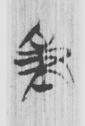秉
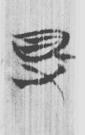𠭁
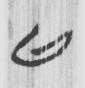㠯（以）
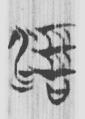{涇口}
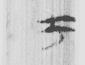于
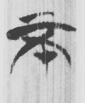不
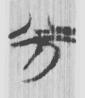{八万}
